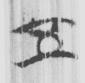五
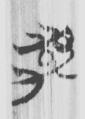爭
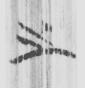之
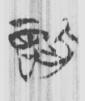訿
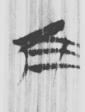隹
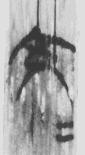交=
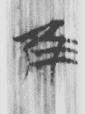隹
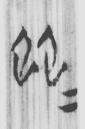{化化}=
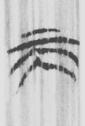而
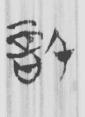信
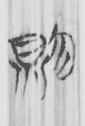則
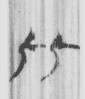比
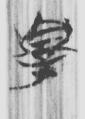辠
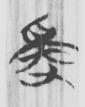{爯又}
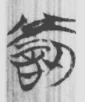罰
